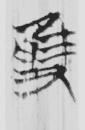雘
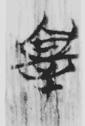辠
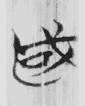或
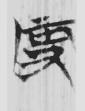辱
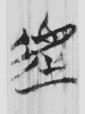𫊟
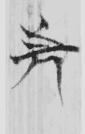先
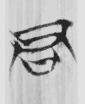君
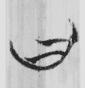曰
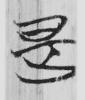是
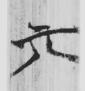亓
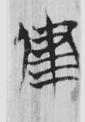{人𦘔}
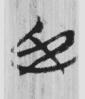臣
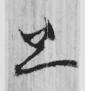也
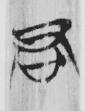君
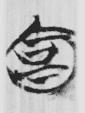答
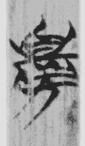臱
